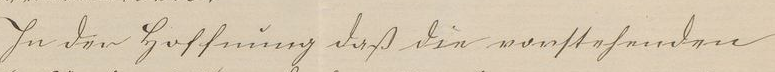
In der Hoffnung daß die vorstehenden
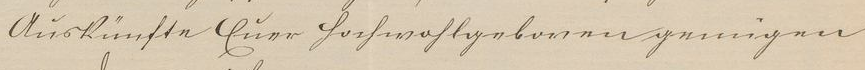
Auskünfte Euer Hochwohlgeboren genügen
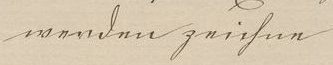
werden zeichne
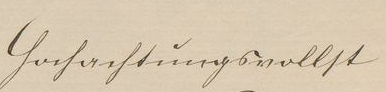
Hochachtungsvollst
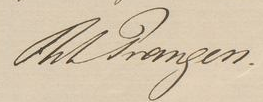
W Prangen
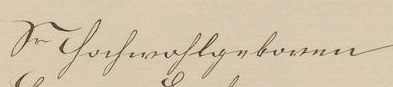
Sr Hochwohlgeboren
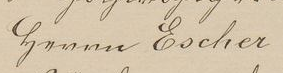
Herrn Escher
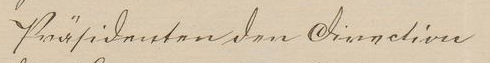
Präsidenten der Direction
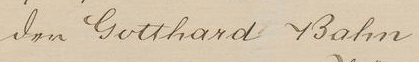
der Gotthard Bahn
